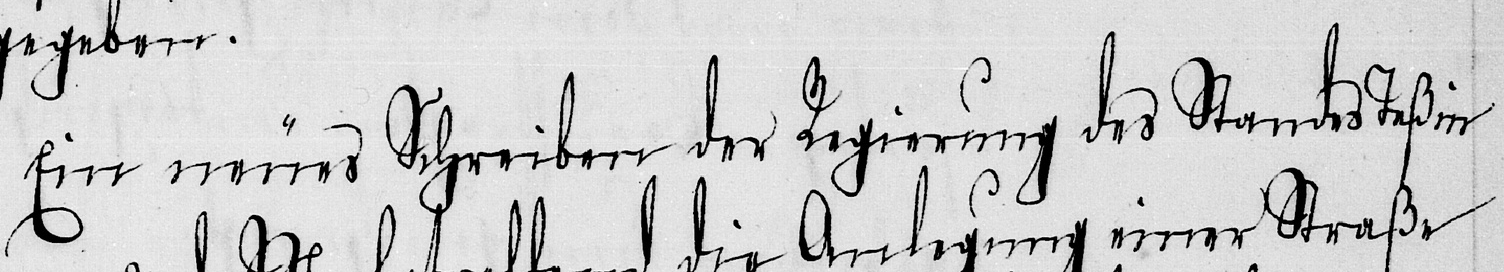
Ein neues Schreiben der Regierung des Standes Teßin
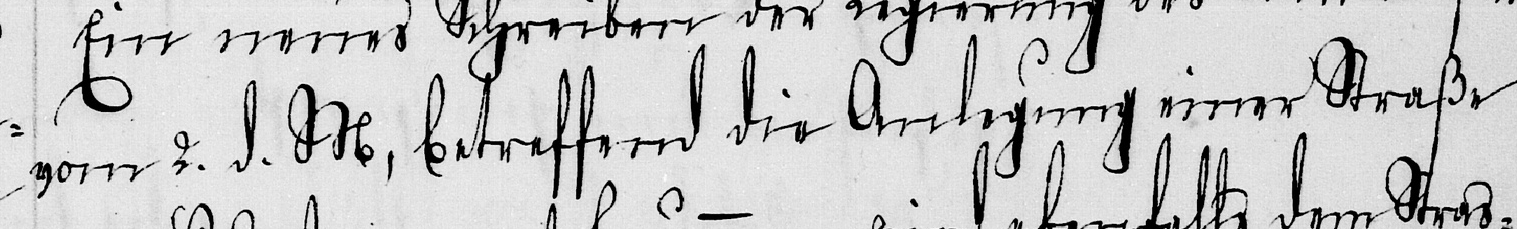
vom 2. d. M, betreffend die Anlegung einer Straße
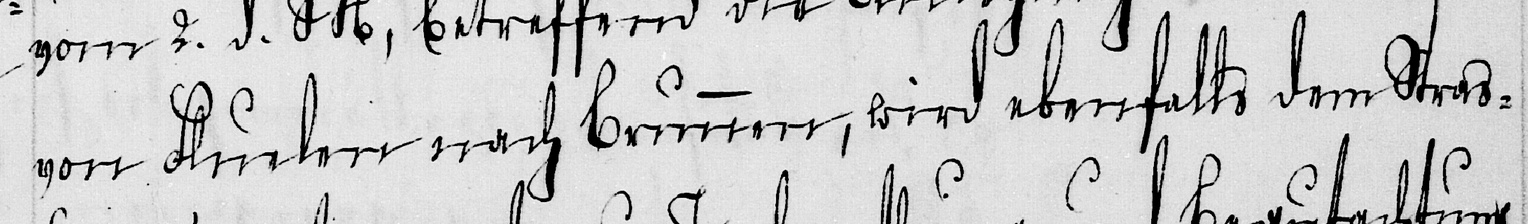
von Fluelen nach Brunnen, wird ebenfalls dem Stra¬
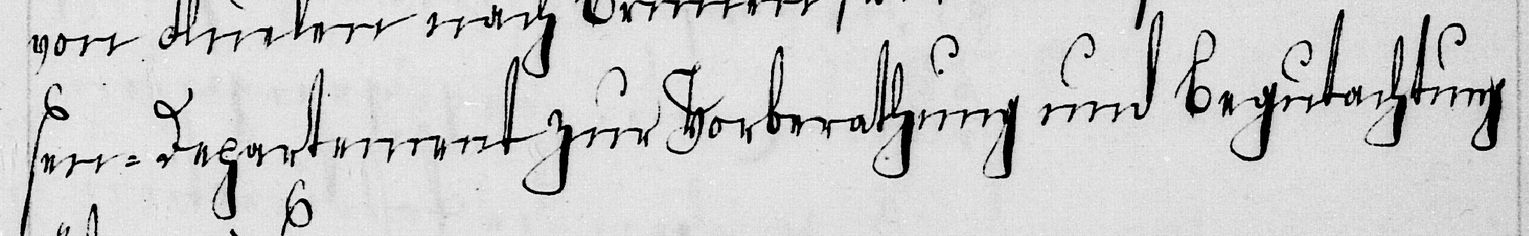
ßen-Departement zur Vorberathung und Begutachtung
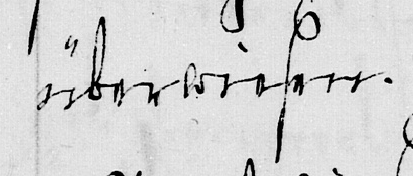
überwiesen.
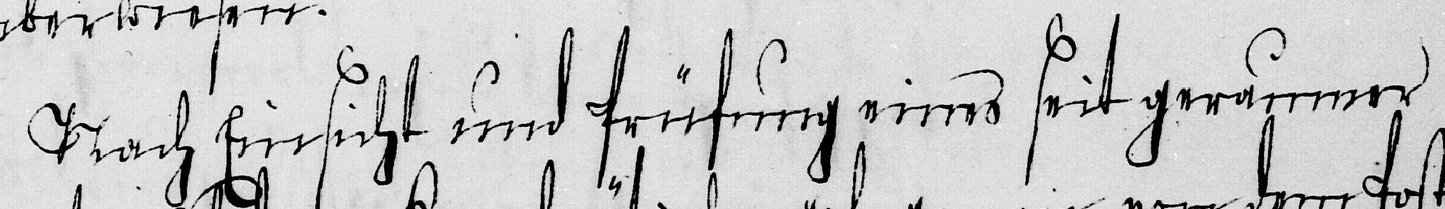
Nach Einsicht und Prüfung eines seit geraumer
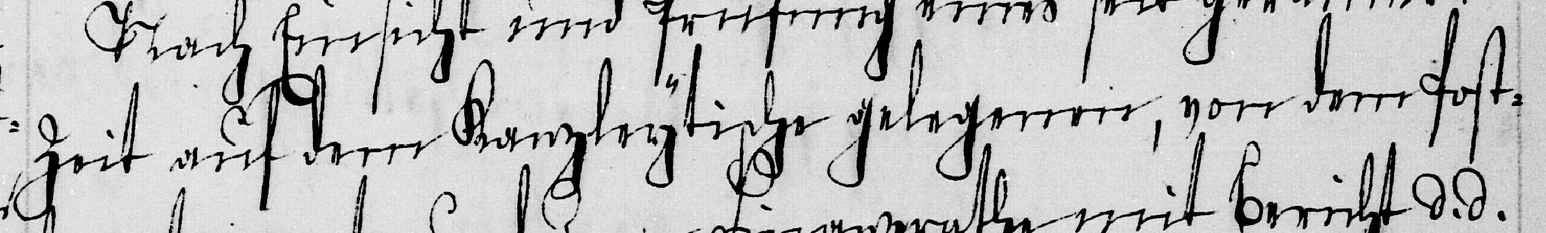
Zeit auf dem Kanzleytische gelegenen, von dem Post¬
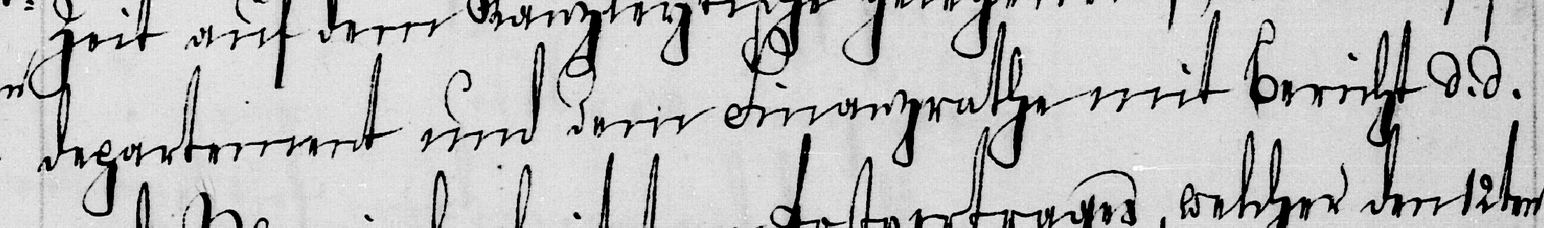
departement und dem Finanzrathe mit Bericht d. d.
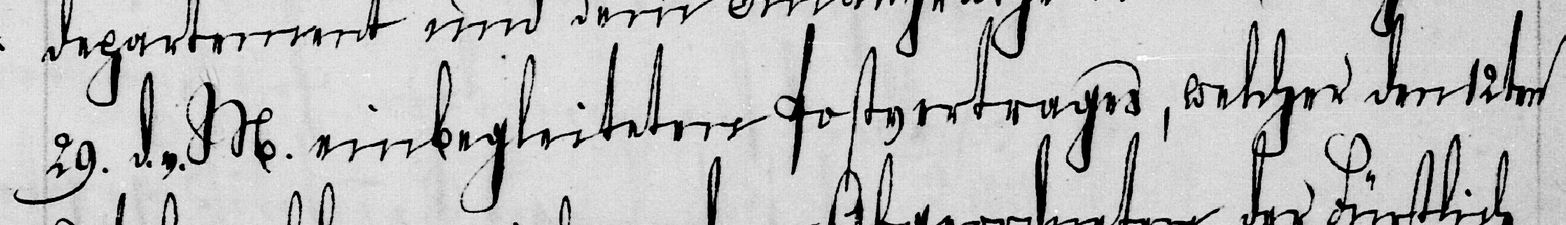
29. d. v. M. einbegleiteten Postvertrages, welcher den 12ten
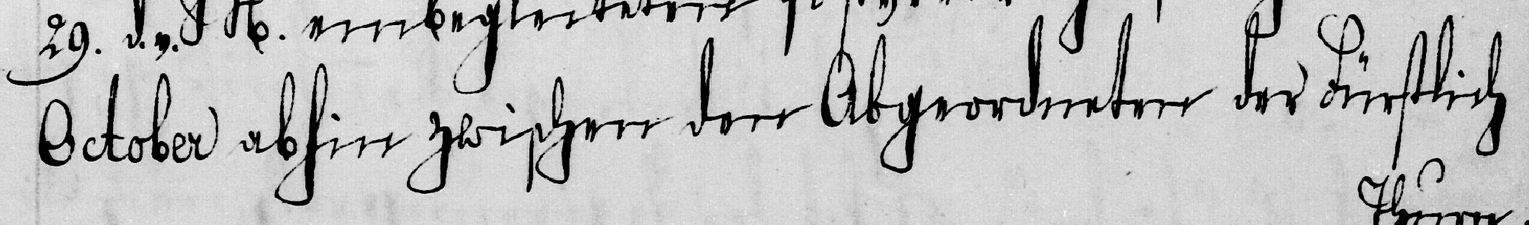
October abhin zwischen den Abgeordneten der Fürstlich
